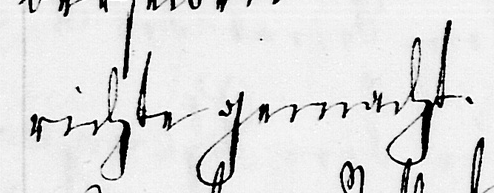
richte gemacht.
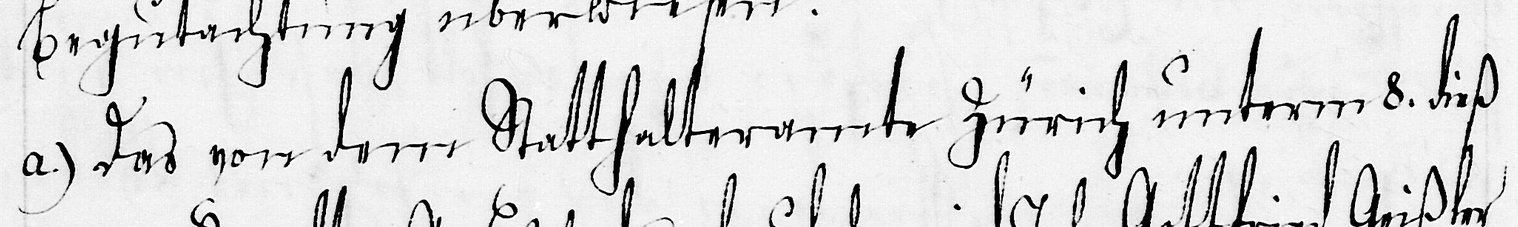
1.)] Das von dem Statthalteramte Zürich unterm 8. dieß
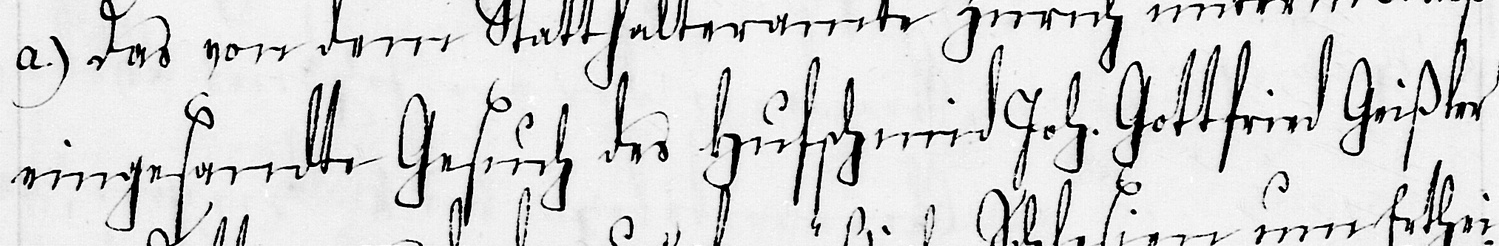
eingesandte Gesuch des Hufschmid Joh. Gottfried
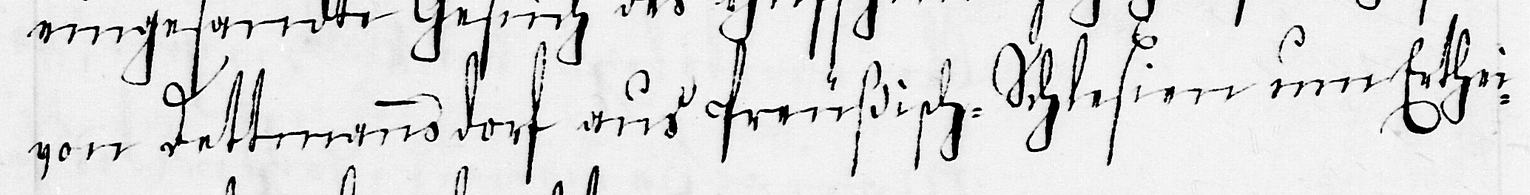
von Dettmannsdorf aus Preußisch-Schlesien um Erthei¬
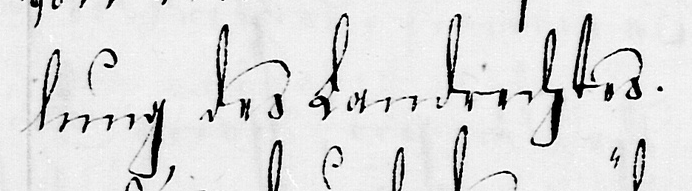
lung des Landrechtes.
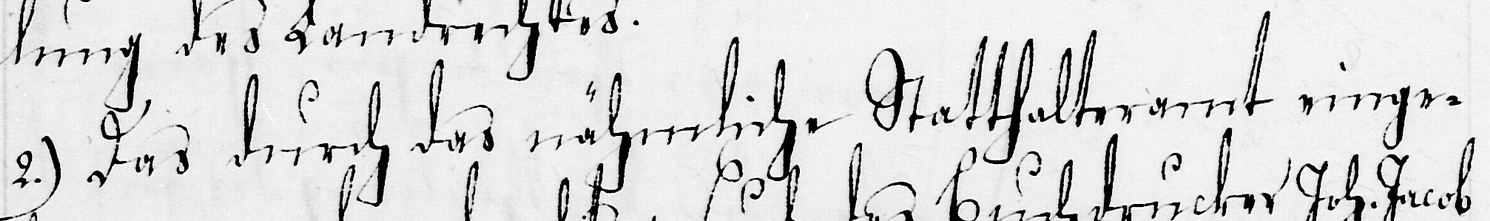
2.) Das durch das nähmliche Statthalteramt einge¬
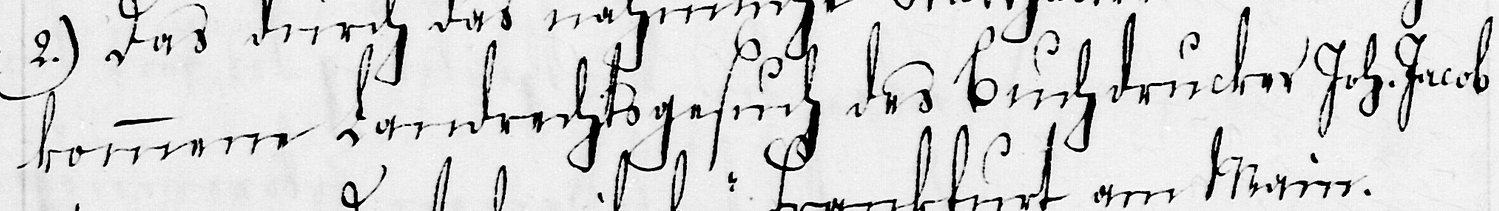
kommene Landrechtsgesuch des Buchdrucker Joh. Jacob
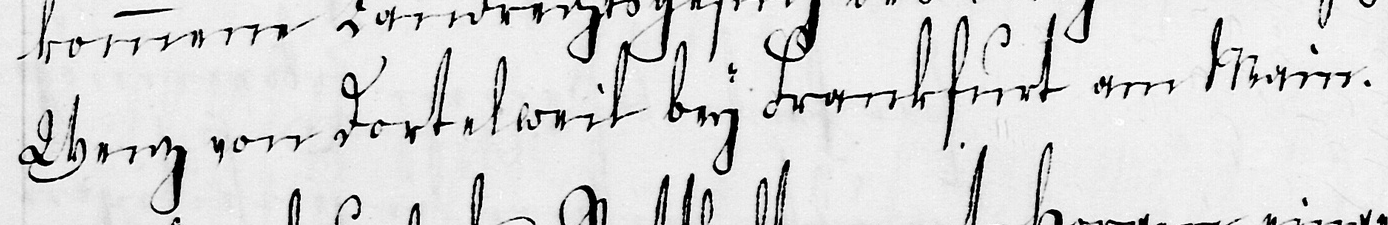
Wenz von Dortelweil bey Frankfurt am Main.
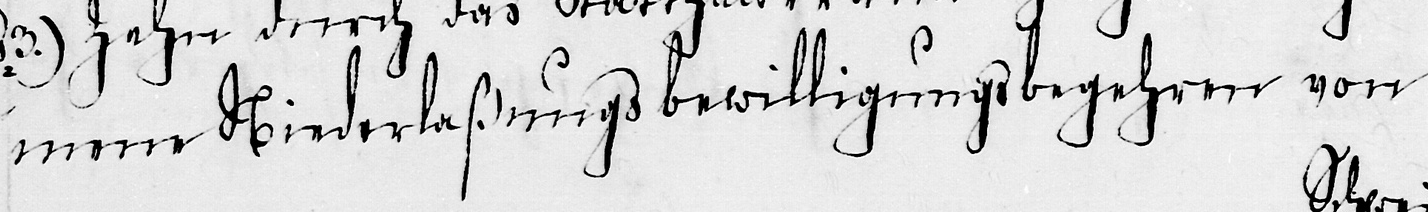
mene Niederlaßungsbewilligungsbegehren von
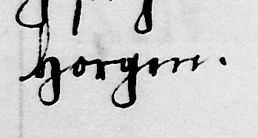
Horgen
